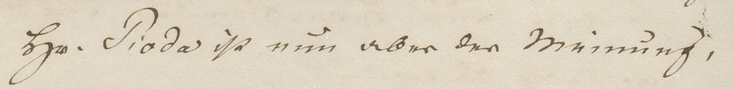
Hr. Pioda ist nun aber der Meinung,
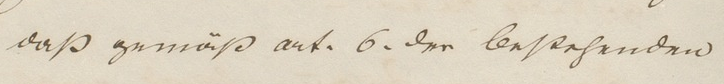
daß gemäß art. 6. der bestehenden
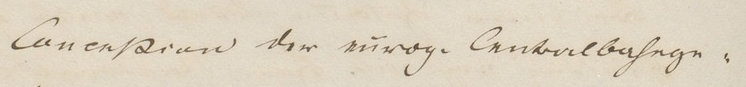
Conceßion der europ. Centralbahnge-
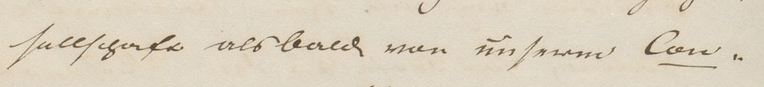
sellschaft alsbald von unserm Con-
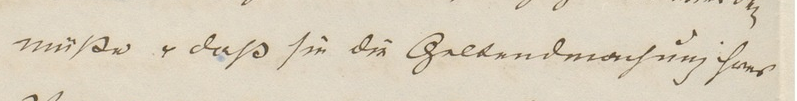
müße & daß sie die Geltendmachung ihres
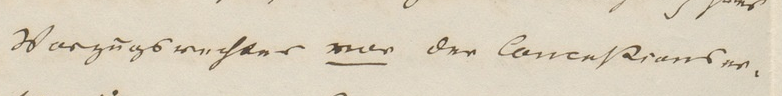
Vorzugsrechtes vor der Conceßionser-
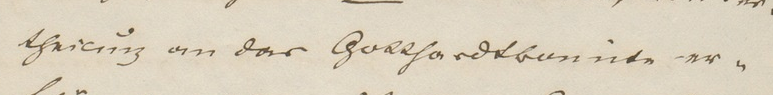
theilung an das Gotthardtkomite er-
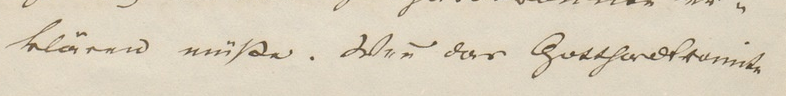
klären müße. Wenn das Gotthardtkomite
